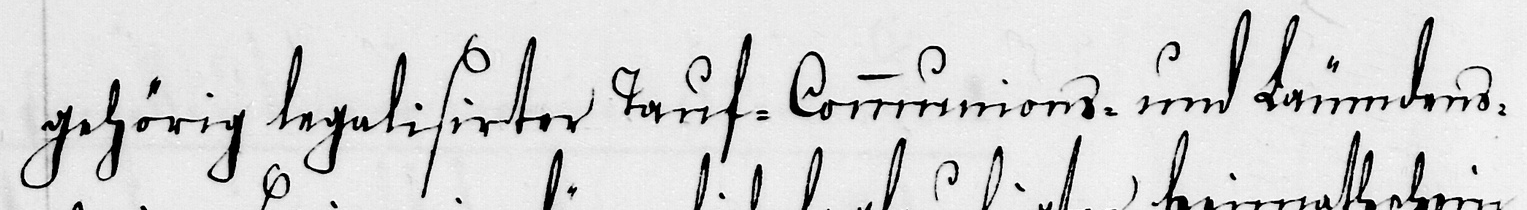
gehörig legalisirter Tauf-[,] Communions- und Läumdens¬
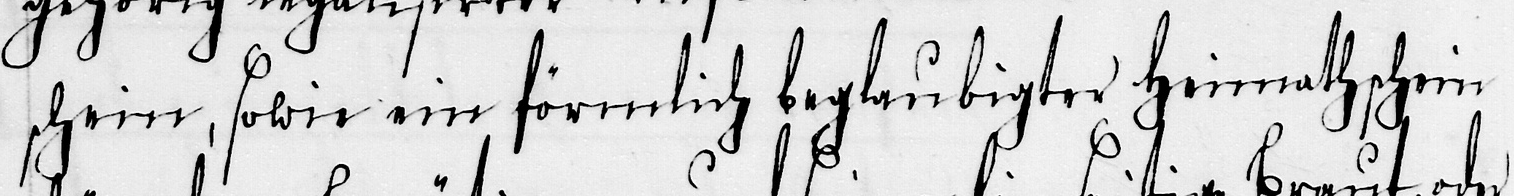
schein, sowie ein förmlich beglaubigter Heimathschein
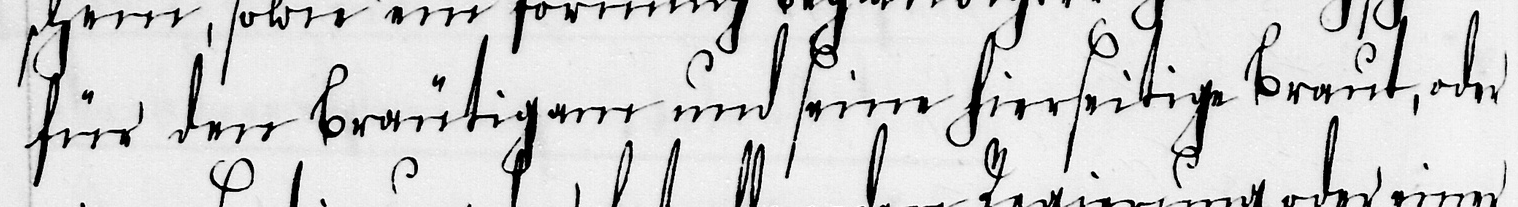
für den Bräutigam und seine hierseitige Braut, oder
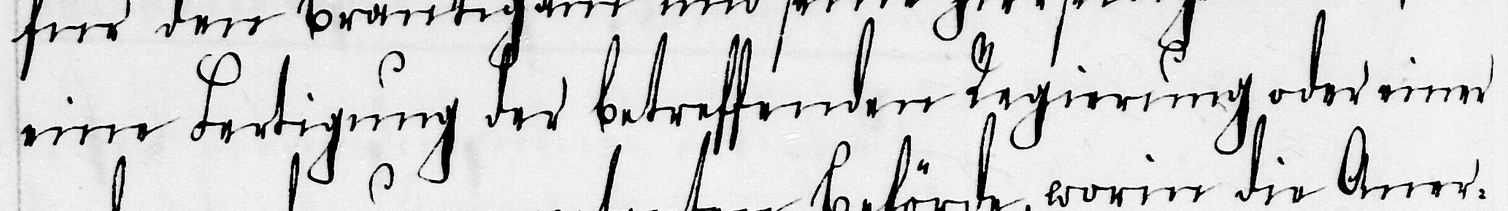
eine Fertigung der betreffenden Regierung oder einer
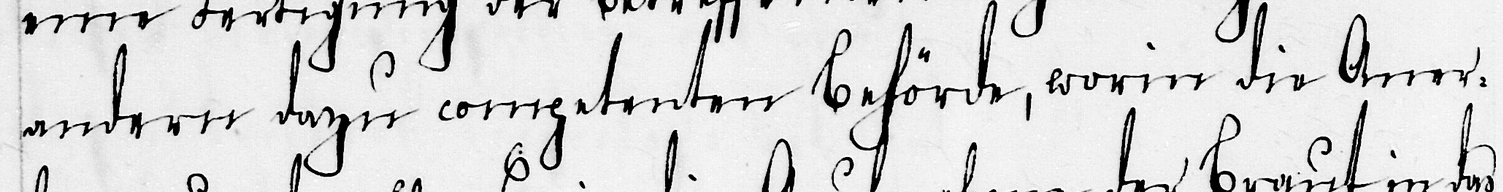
andern dazu competenten Behörde, worin die Aner¬
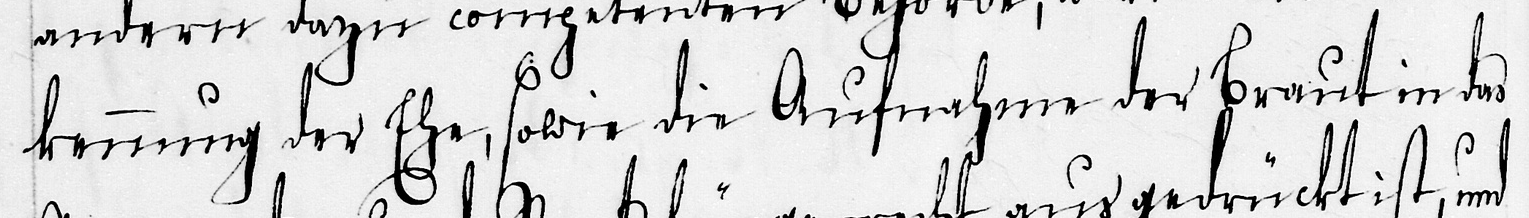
kennung der Ehe, sowie die Aufnahme der Braut in das
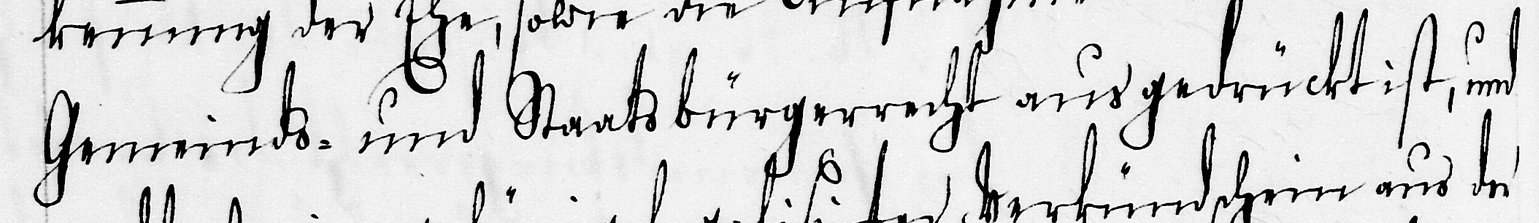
Gemeinds- und Staatsbürgerrecht ausgedrückt ist, und
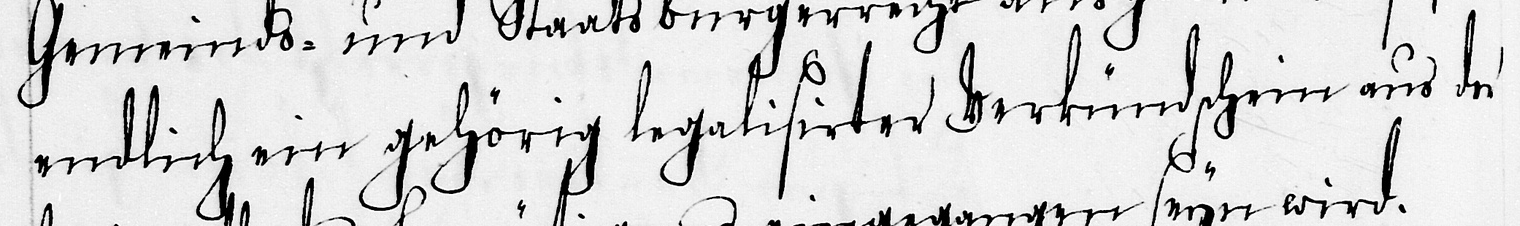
endlich ein gehörig legalisirter Verkündschein aus der
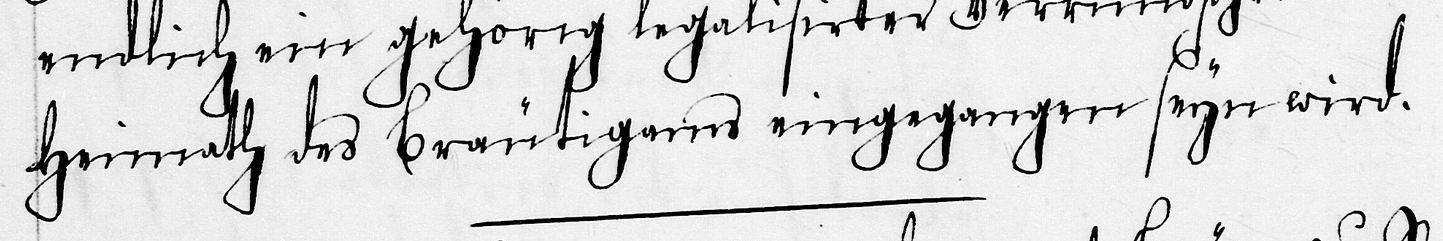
Heimath des Bräutigams eingegangen seyn wird.
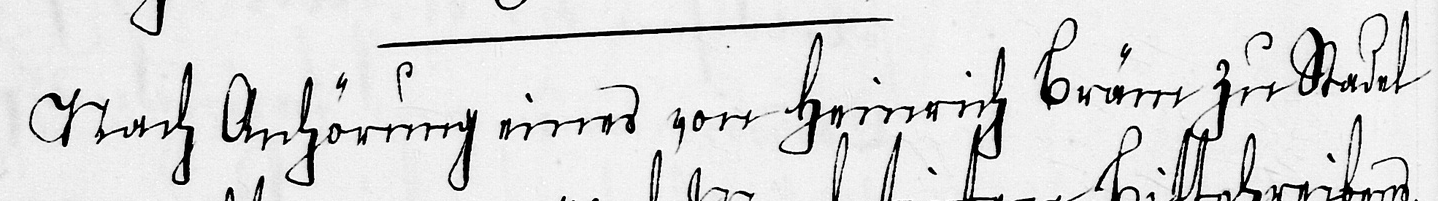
Nach Anhörung eines von Heinrich Bräm zu Stadel
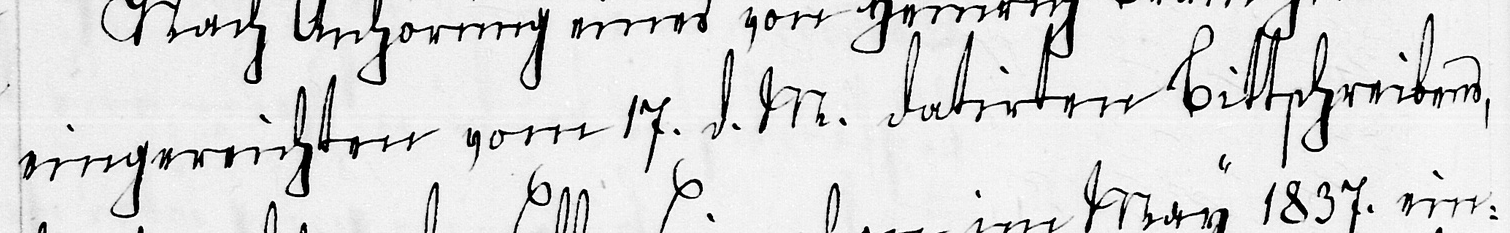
eingereichten vom 17. d. M. datirten Bittschreibens,
